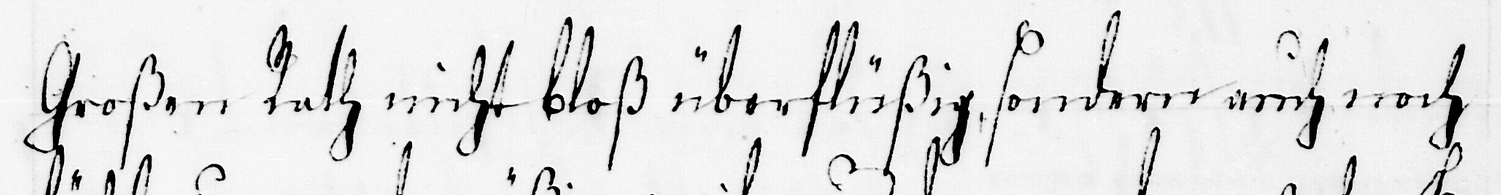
Großen Rath nicht bloß überflüßig, sondern auch noch
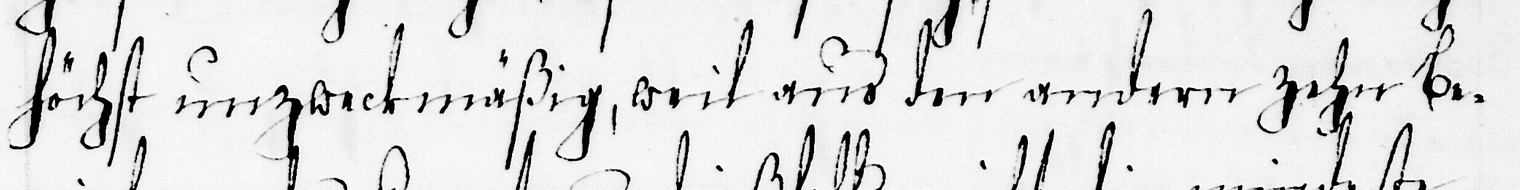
höchst unzweckmäßig, weil aus den andern zehn Be¬
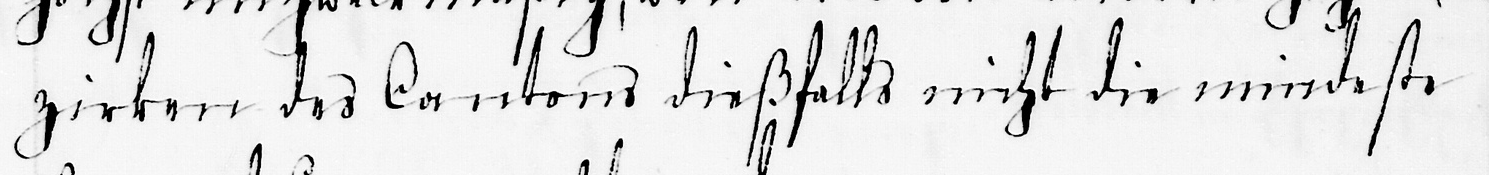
zirken des Cantons dießfalls nicht die mindeste
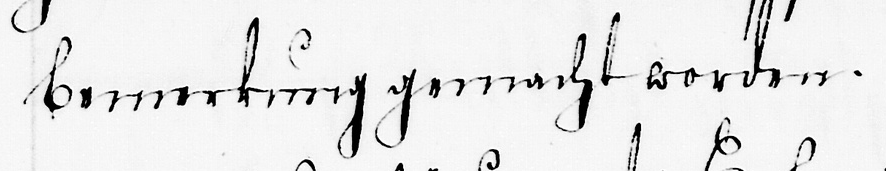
Bemerkung gemacht worden.
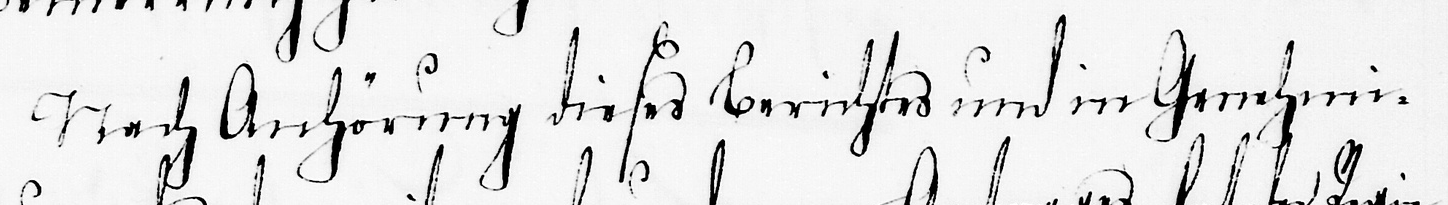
Nach Anhörung dieses Berichtes und in Genehmi¬
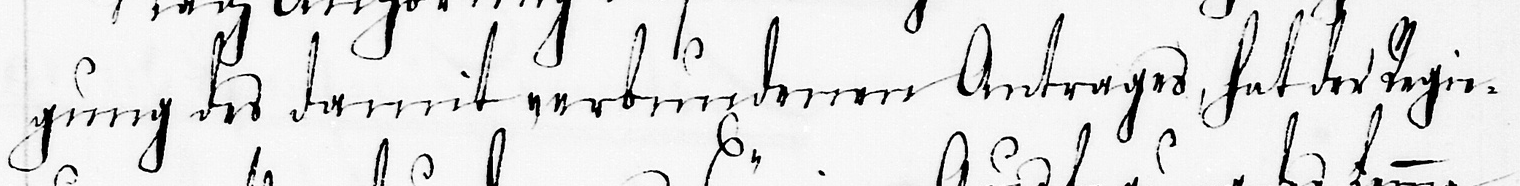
gung des damit verbundenen Antrages, hat der Regie¬
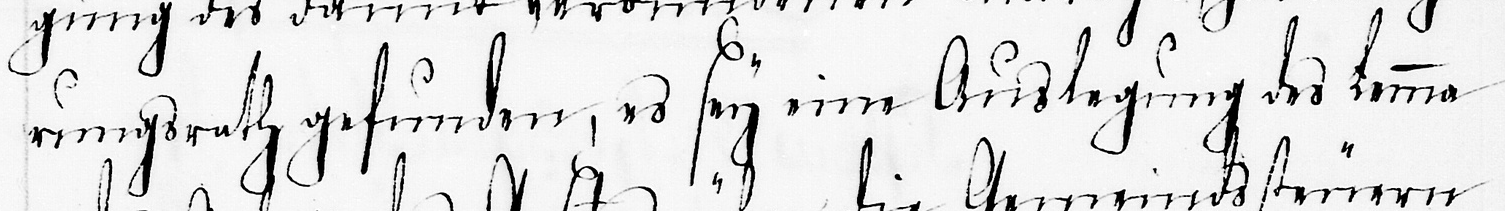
rungsrath gefunden, es sey eine Auslegung des Lemma
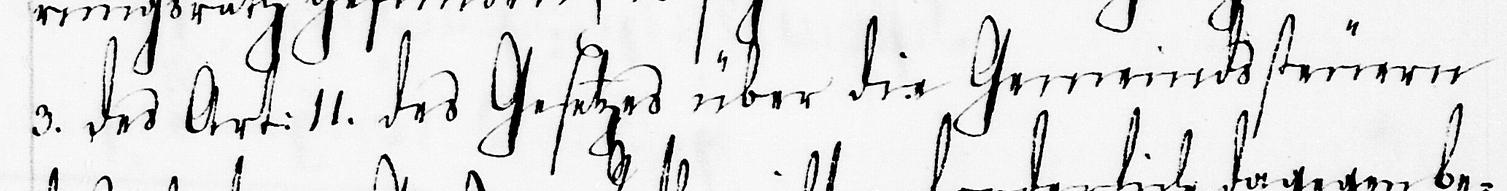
3. des Art: 11. des Gesetzes über die Gemeindssteuern
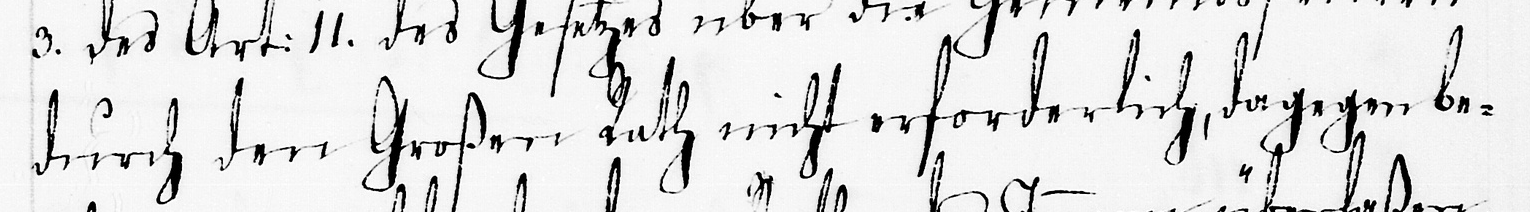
durch den Großen Rath nicht erforderlich, dagegen be¬
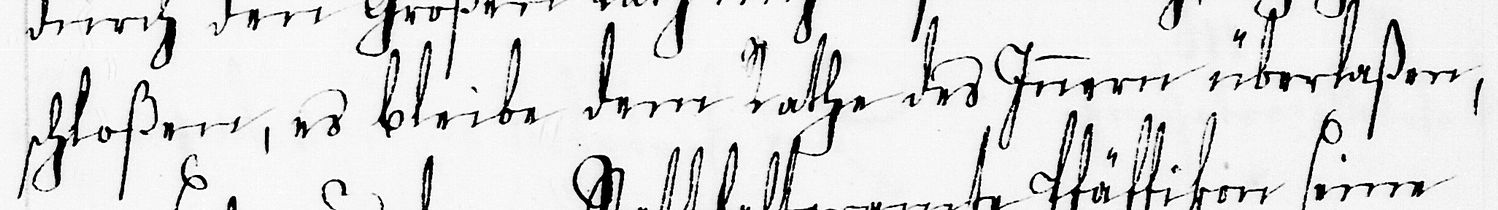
schloßen, es bleibe dem Rathe des Innern überlaßen,
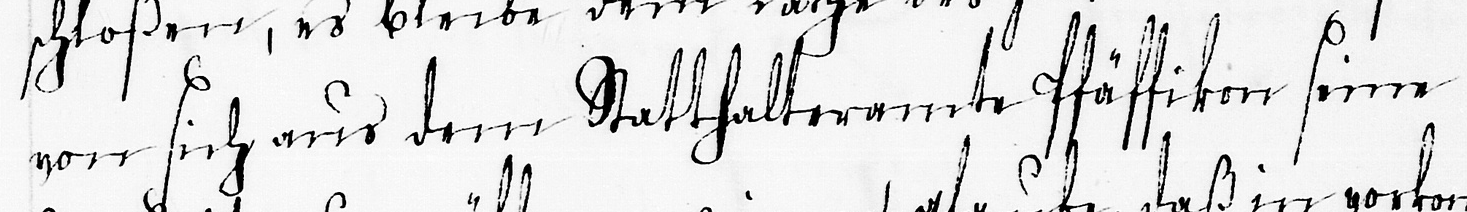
von sich aus dem Statthalteramte Pfäffikon seine
